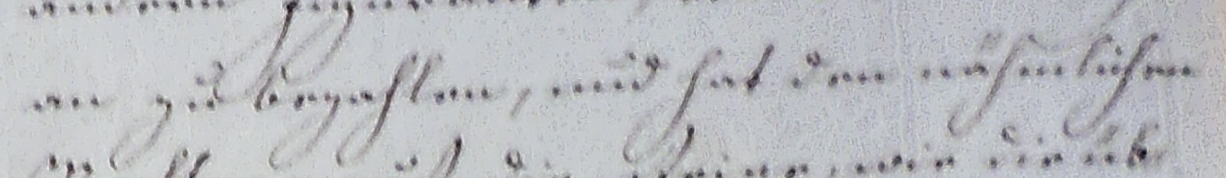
an zu bezahlen, und hat den nähmlichen
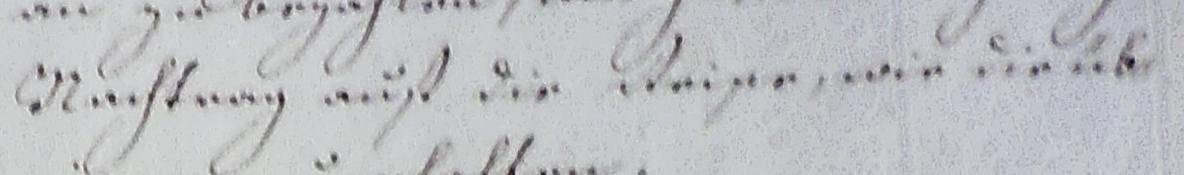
Nachtrag auf die Reise, wie die üb¬
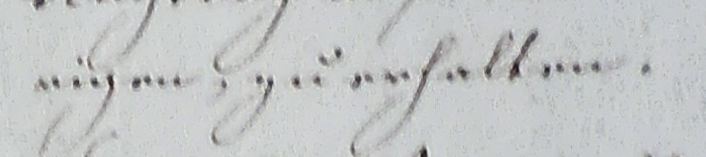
rigen, zu erhalten.
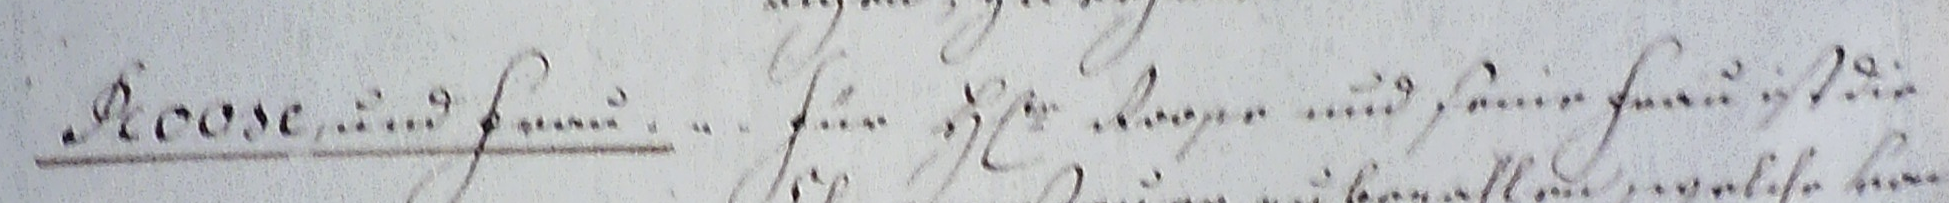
Roose, und Frau. .. Für HEr͇n Roose und seine Frau ist die
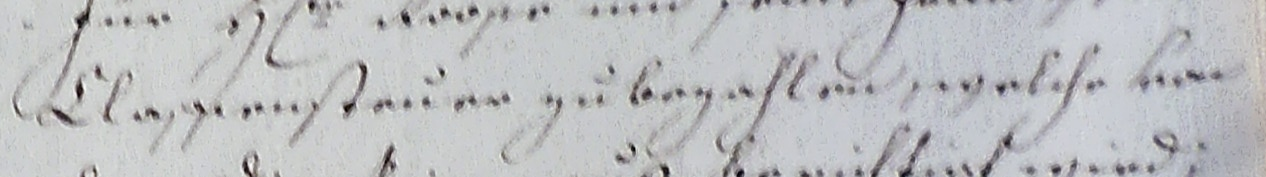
Classensteuer zu bezahlen, welche von
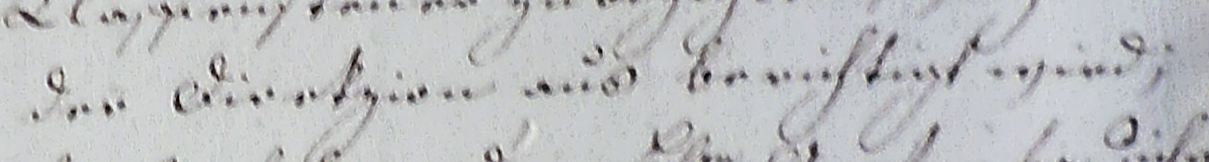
der Direkzion aus berichtigt wird;
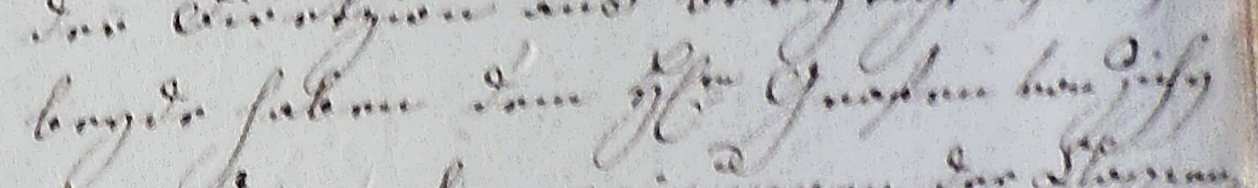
beyde haben dem HEr͇n Grafen von Zichy
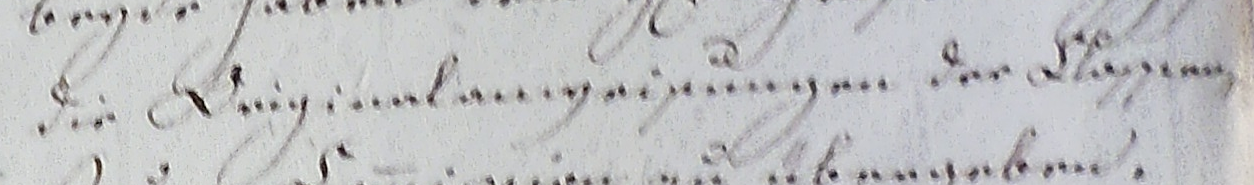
die Originalanweisungen der Classen¬
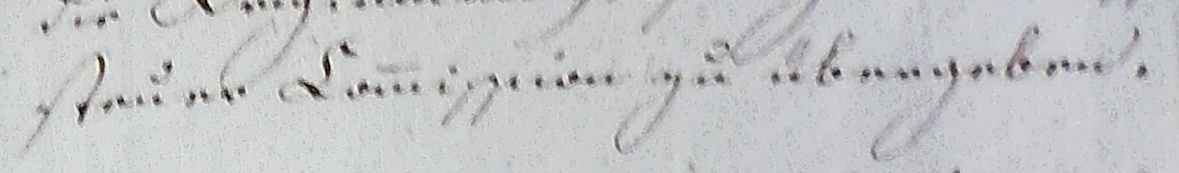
steuer Com̅ission zu übergeben.
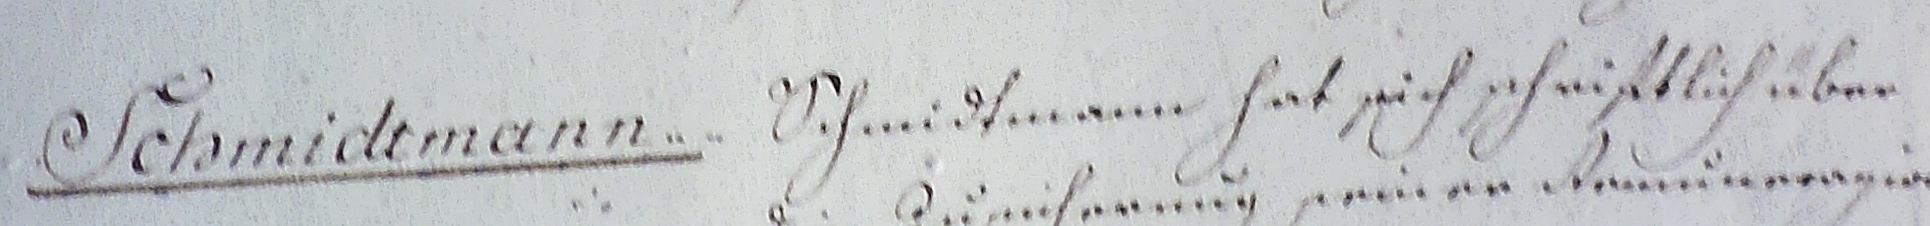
Schmidtmann .. Schmidtmann hat sich schriftlich über
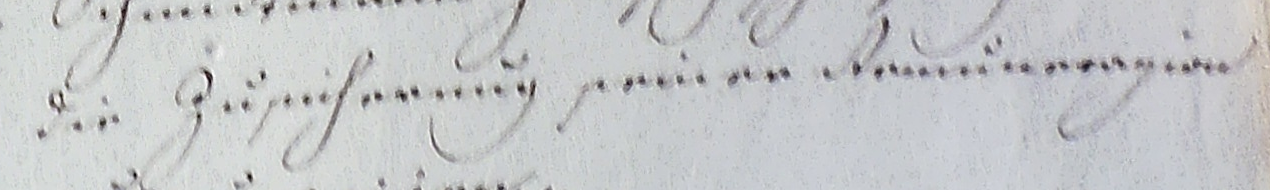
die Zusicherung seiner Remunerazion
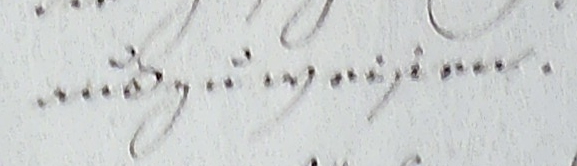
auszuweisen.
